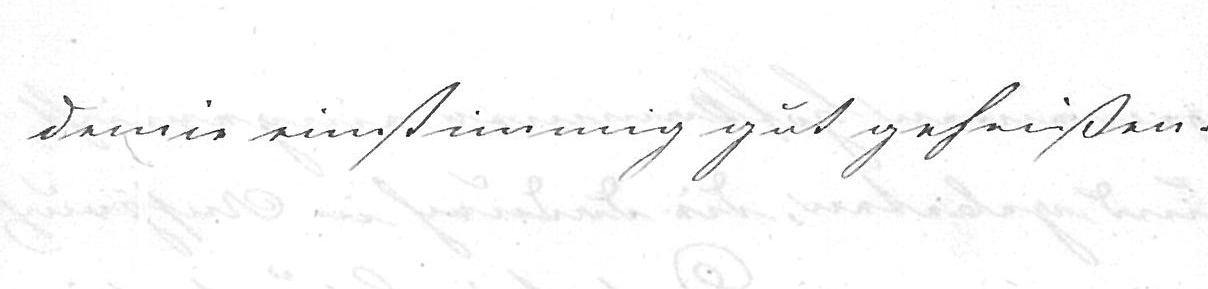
demie einstimmig gut geheißen.
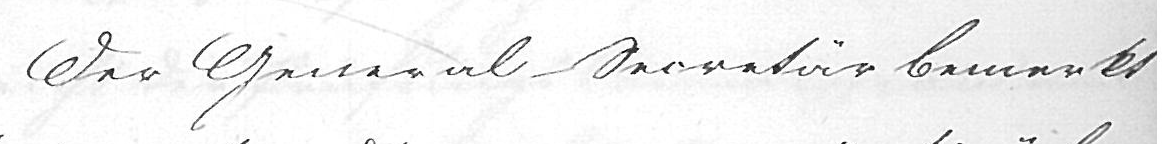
Der General-Secretär bemerkt
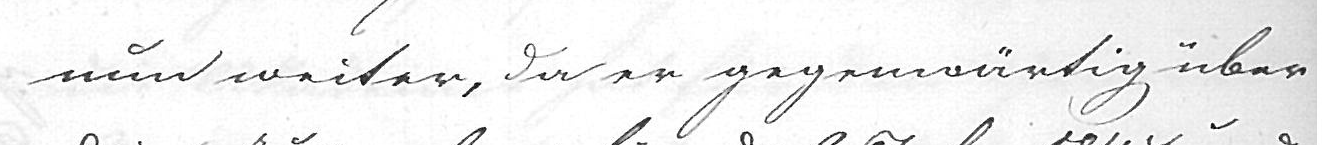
nun weiter, da es gegenwärtig über
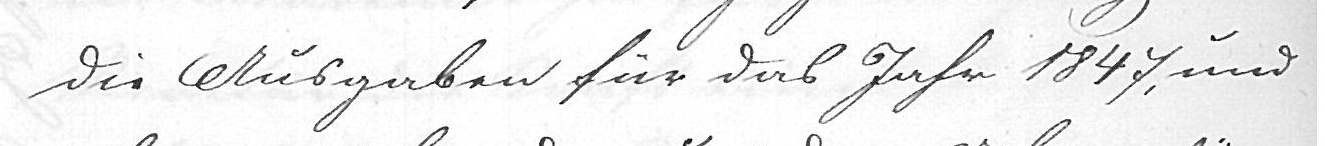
die Ausgaben für das Jahr 1847 und
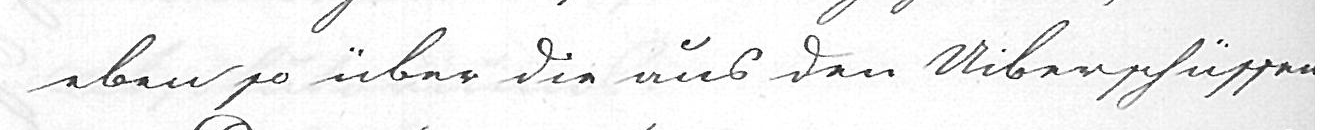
eben so über die aus den Uiberschüssen
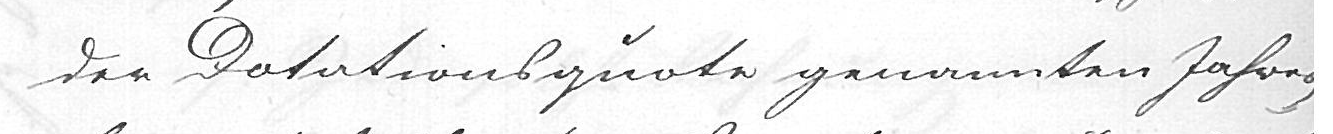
der Dotationsquote genannten Jahre
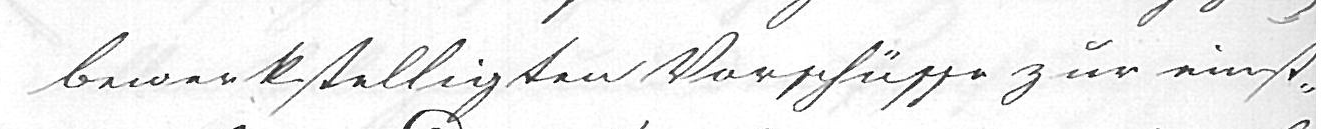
bewerkstelligten Vorschüsse zur einst-
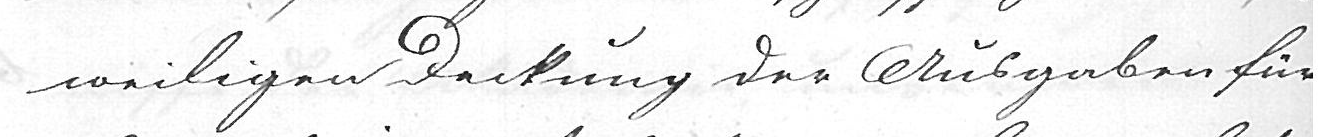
weiligen Deckung der Ausgaben für
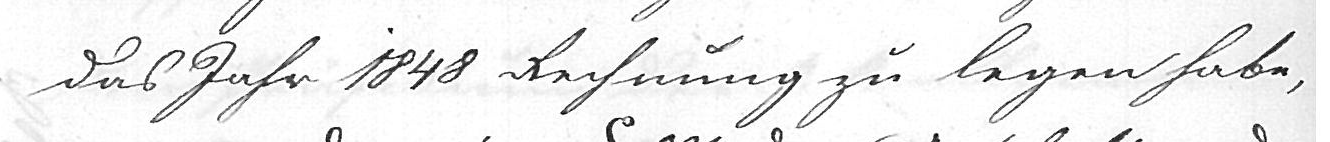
das Jahr 1848 Rechnung zu legen habe;
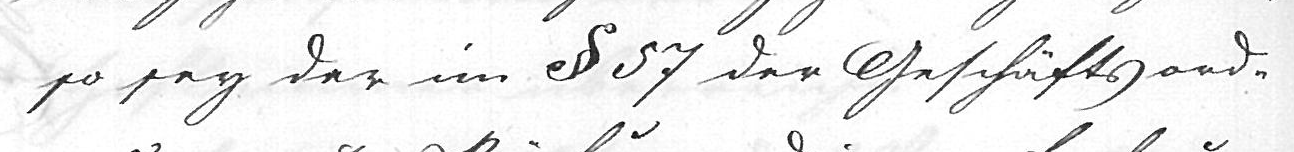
so sey der in § 57 der Geschäftsord-
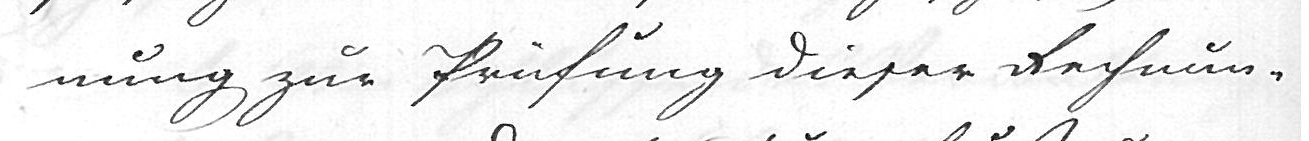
nung zur Prüfung dieser Rechnun-
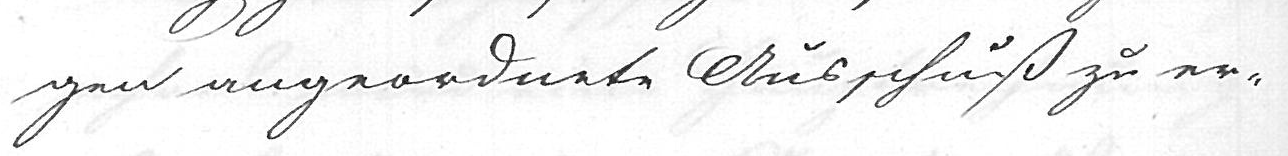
gen angeordnete Ausschuß zu er-
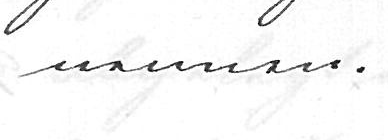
nennen.
